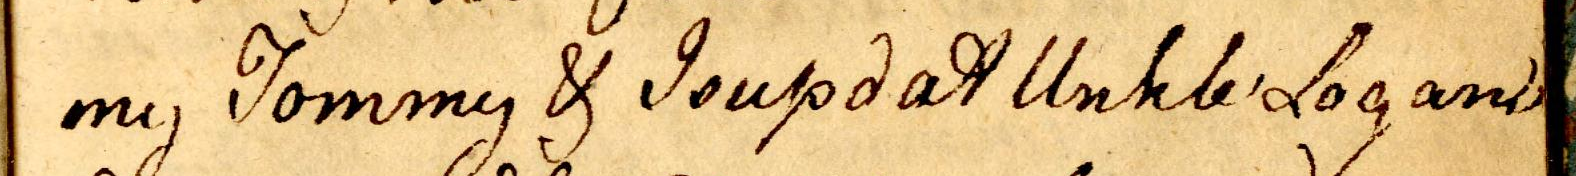my Tommy & I sup'd at Unkle Logan's
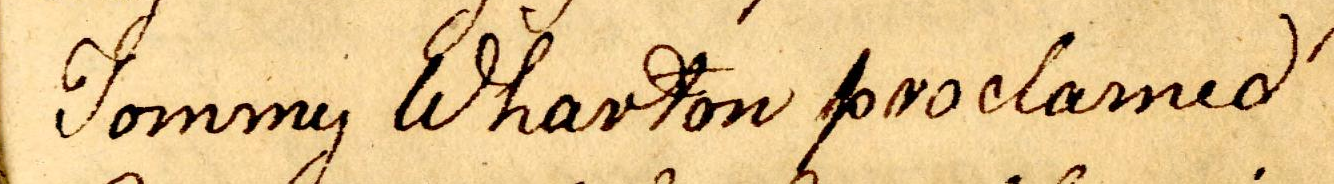Tommy Wharton proclamed
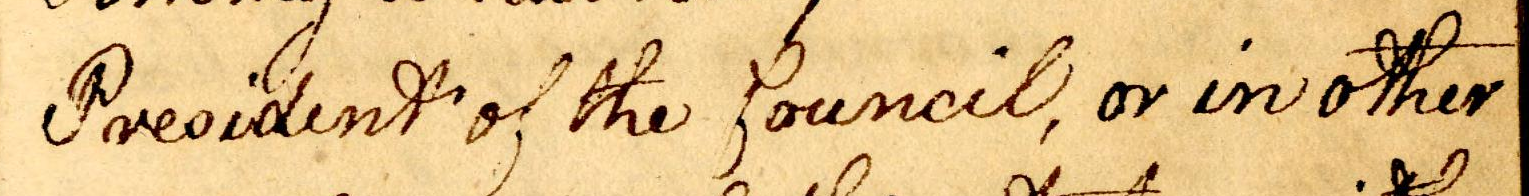President of the Council, or in other
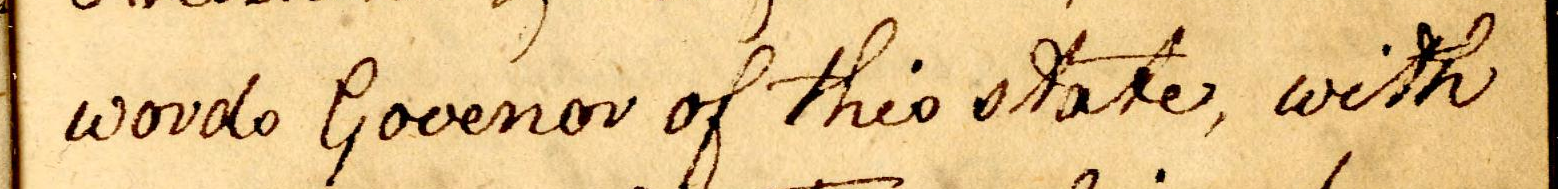words Govenor of this state, with
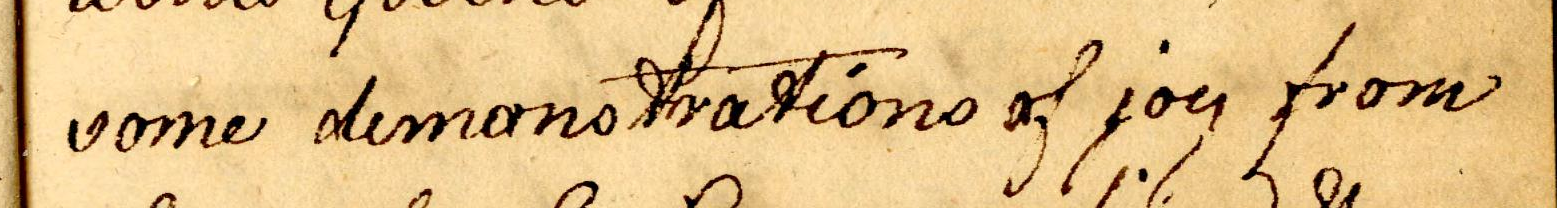some demonstrations of joy from
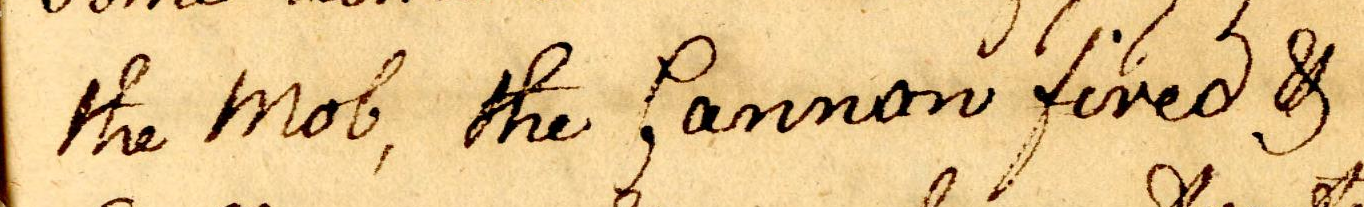the Mob, the Cannon fired &
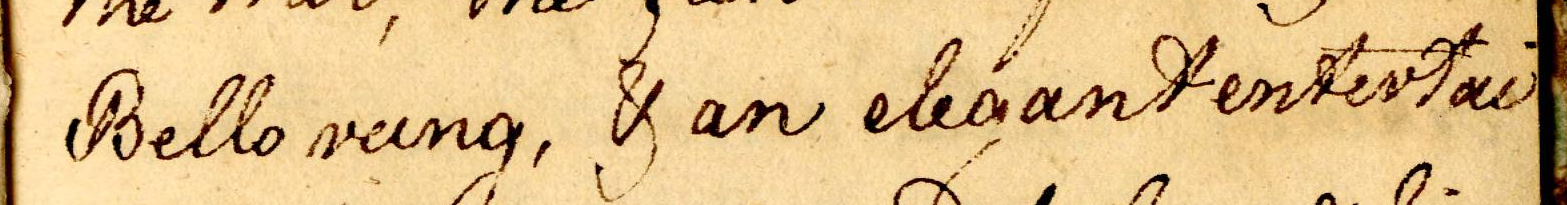Bells rung, & an elegant entertai
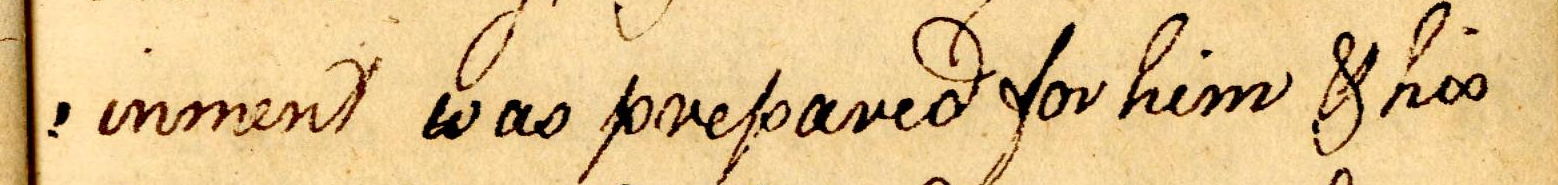-inment was prepared for him & his
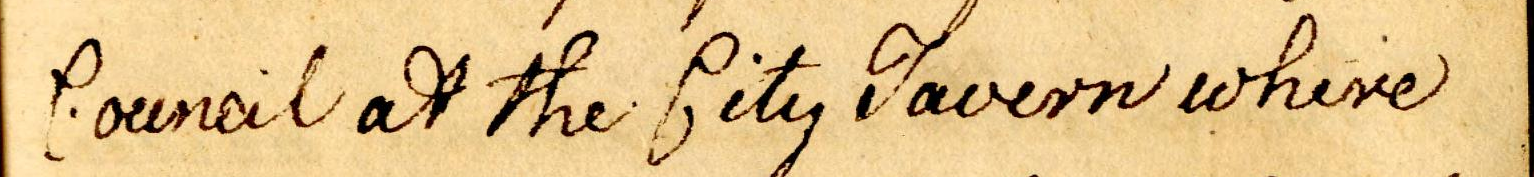Council at the City Tavern where
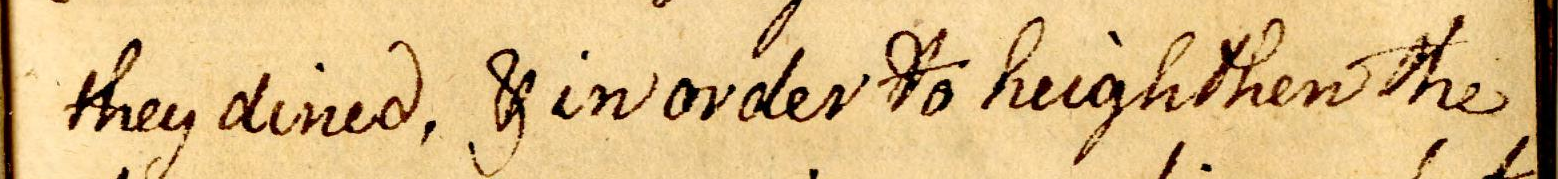they dined, & in order to heighthen the
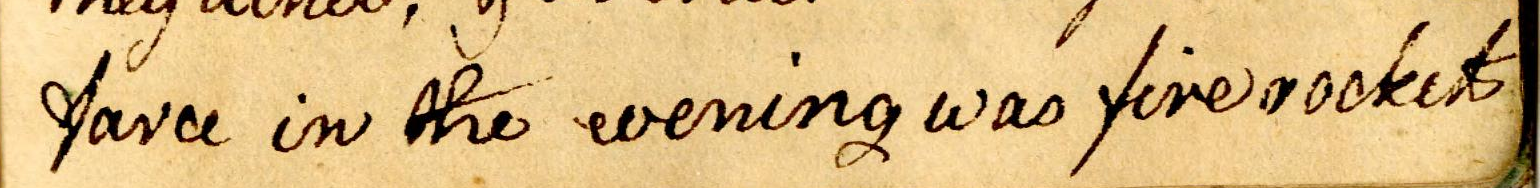farce in the evening was firerockets
